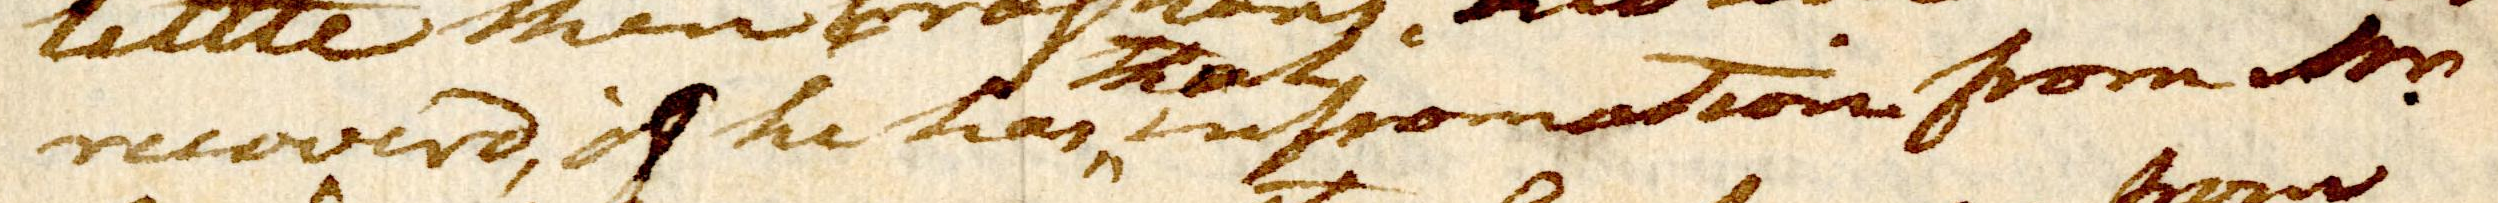recoverd, if he has ^ information from M^r.
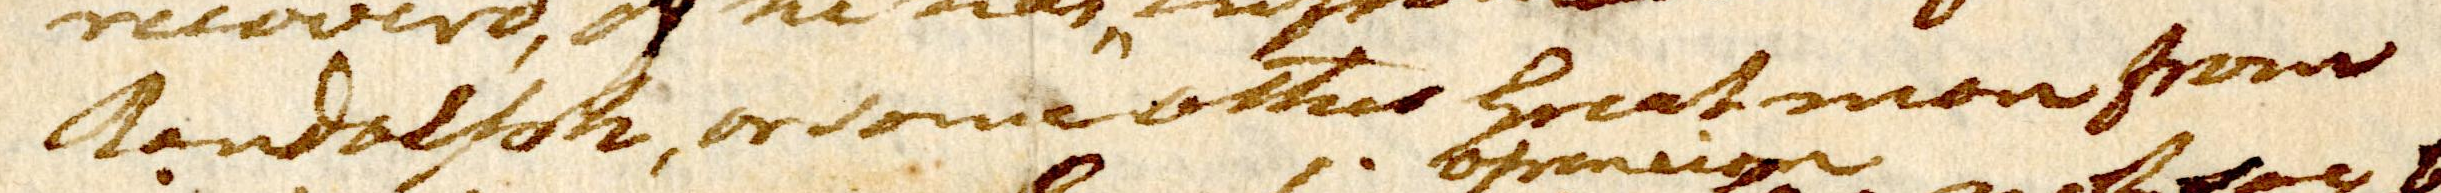Randolph, or some other Great man from
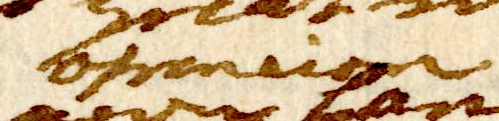opinion
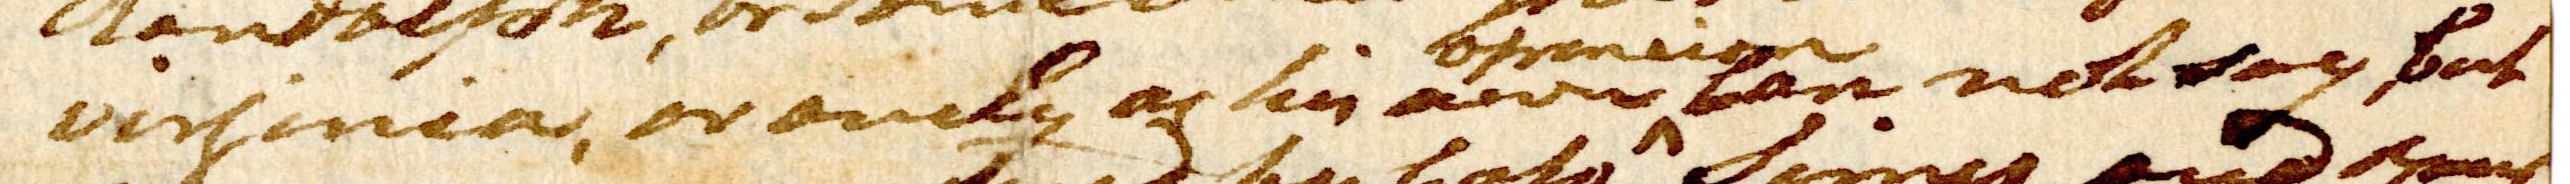Virginia, or only as his own ^ can not say, but
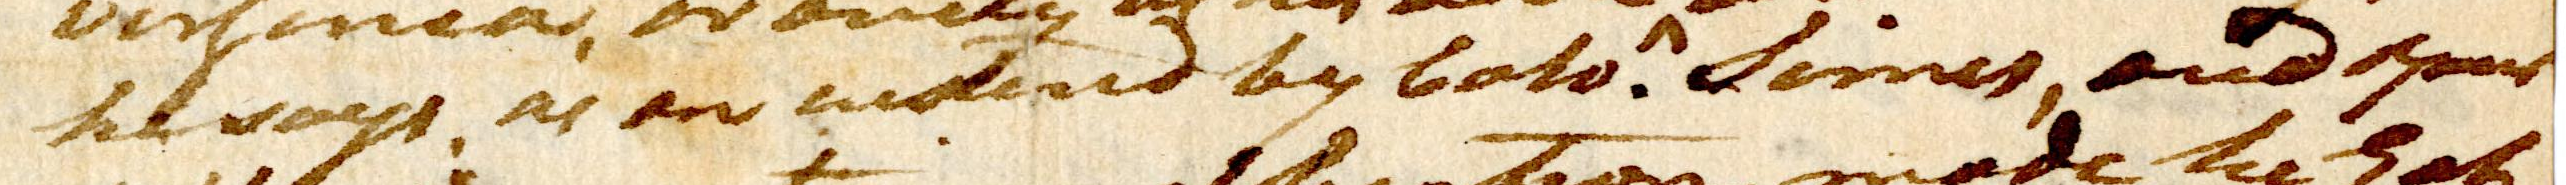he says, as in wanted by Colo. Simon, and your
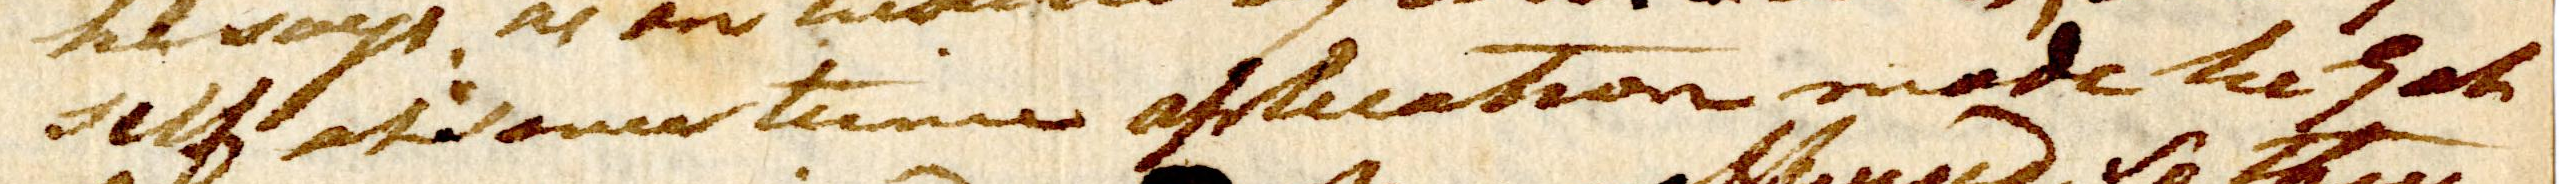self at some time affection made he sah
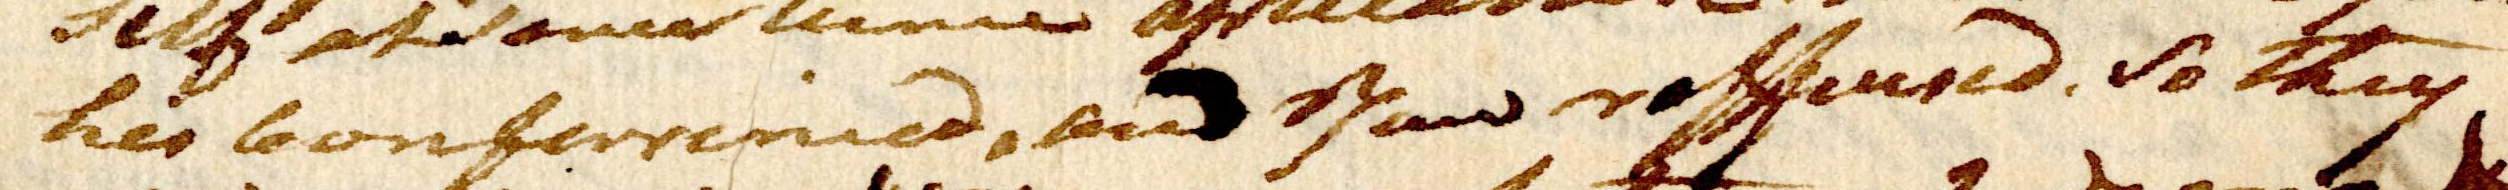has conferrenied, and you reffused, so they
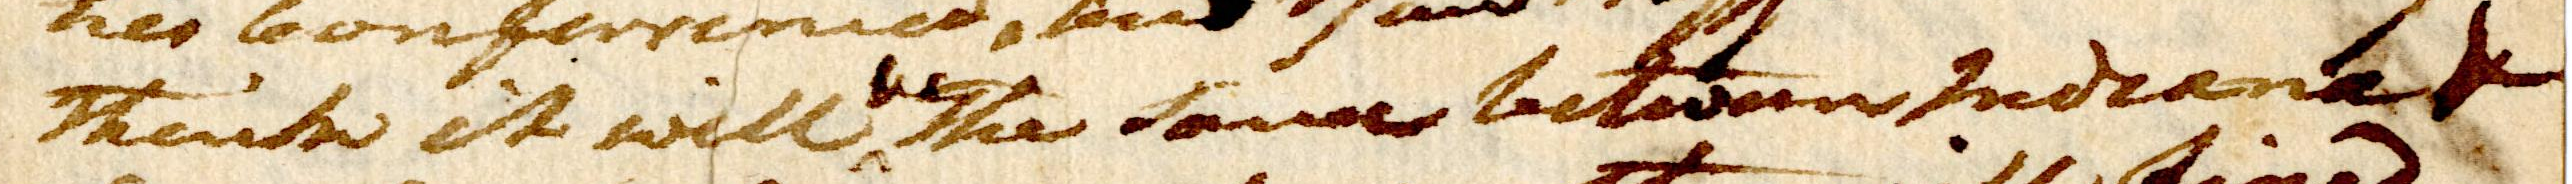think it will ^be the same between Indiana &
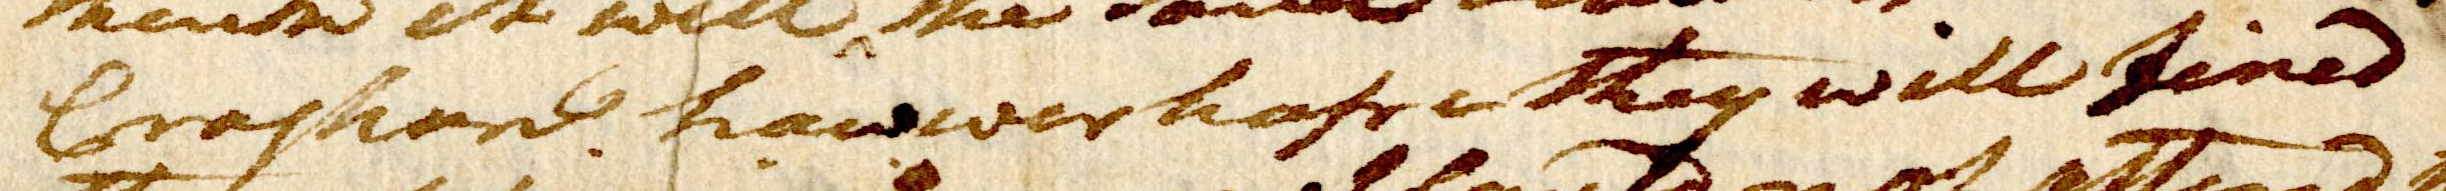Croghan however hope they will fined
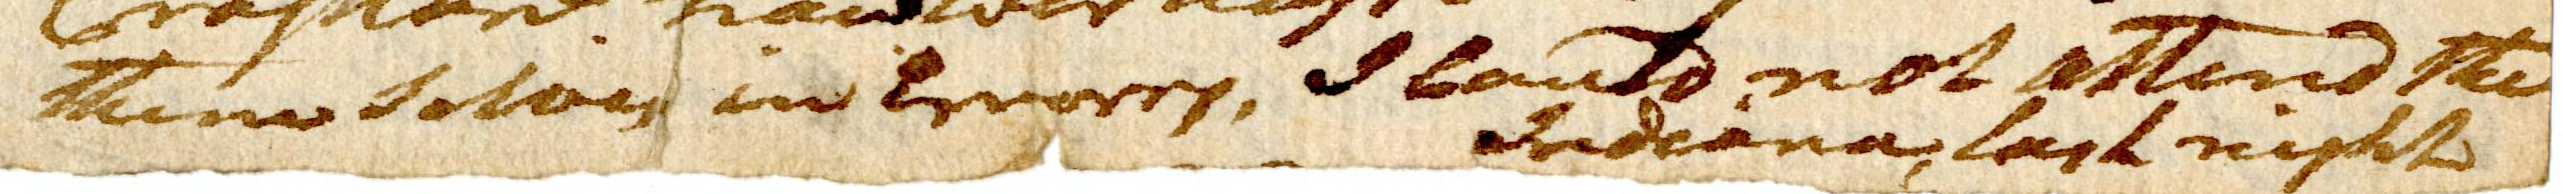them Selves in Errorrs, I could not attend the
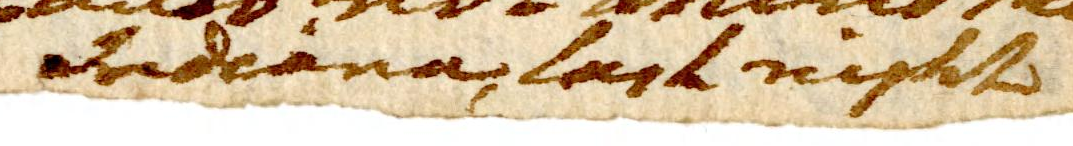Indiana last night
